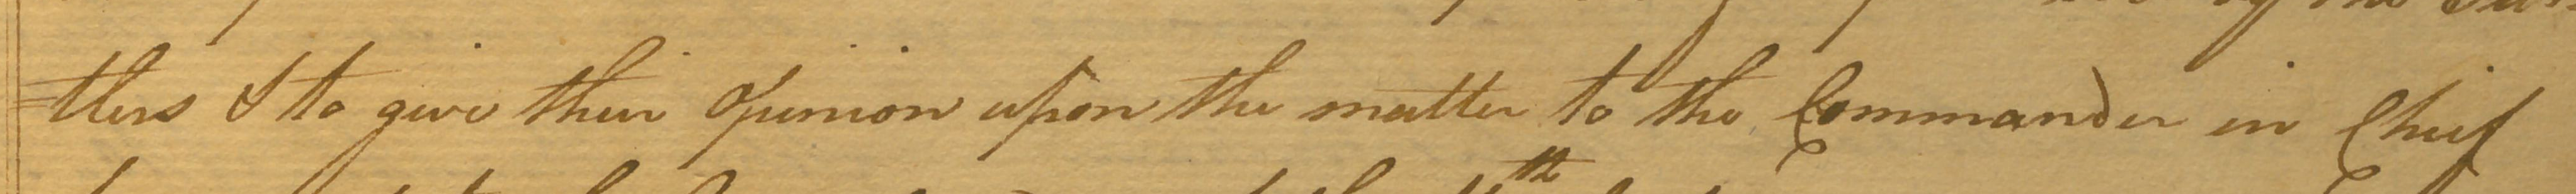-tlers & to give them opinion upon the matter to the Commander in Chief
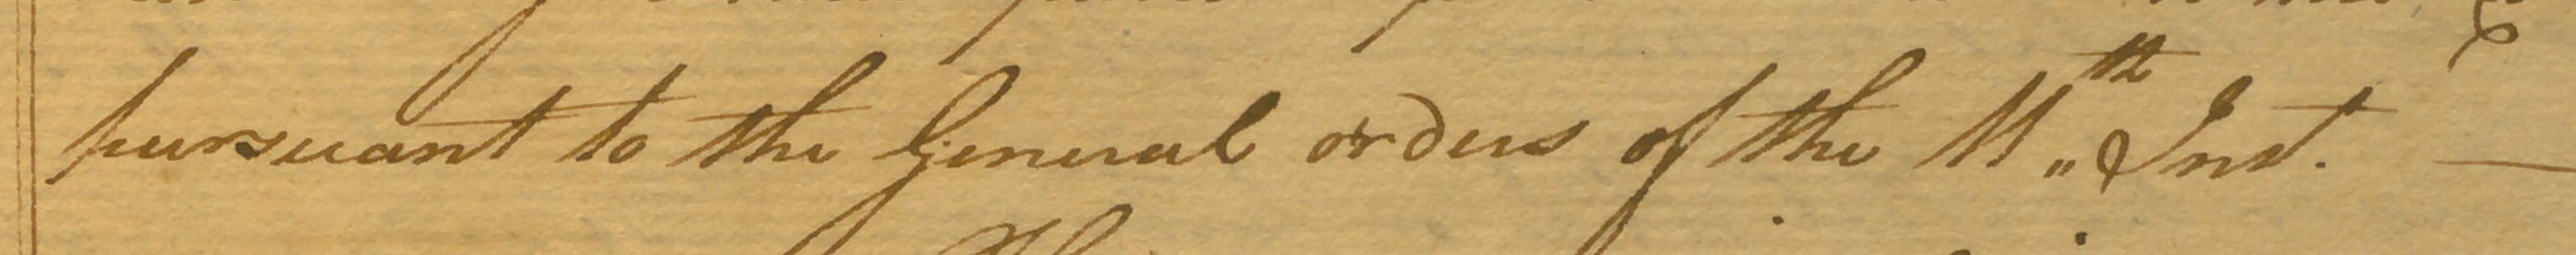pursuant to the General orders of the 11^th. Inst.-
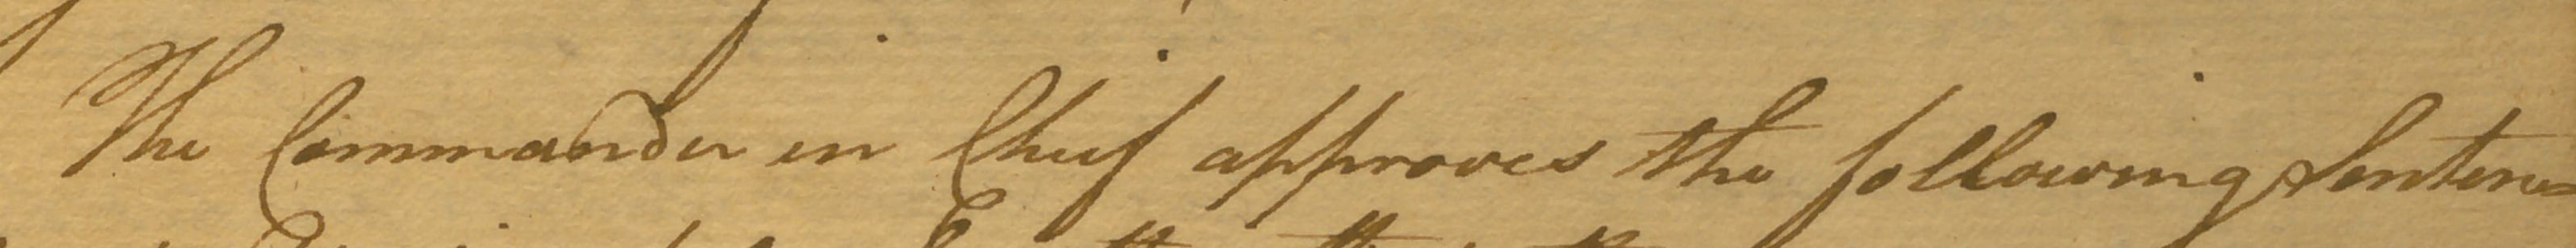The Commander in Chief approves the following Senten-
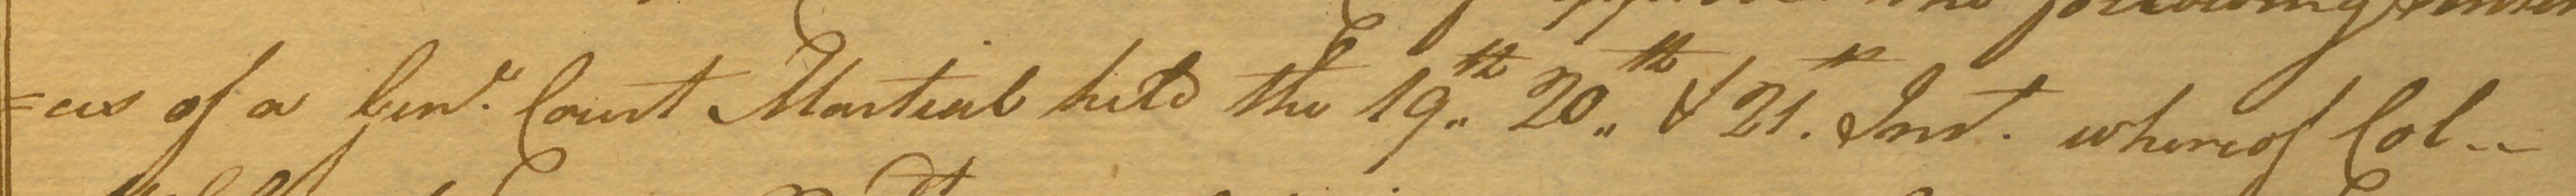-ces of a Gen^l. Court Martial held the 19^th. 20^th. & 21^st. Ins^t. whereof Col.
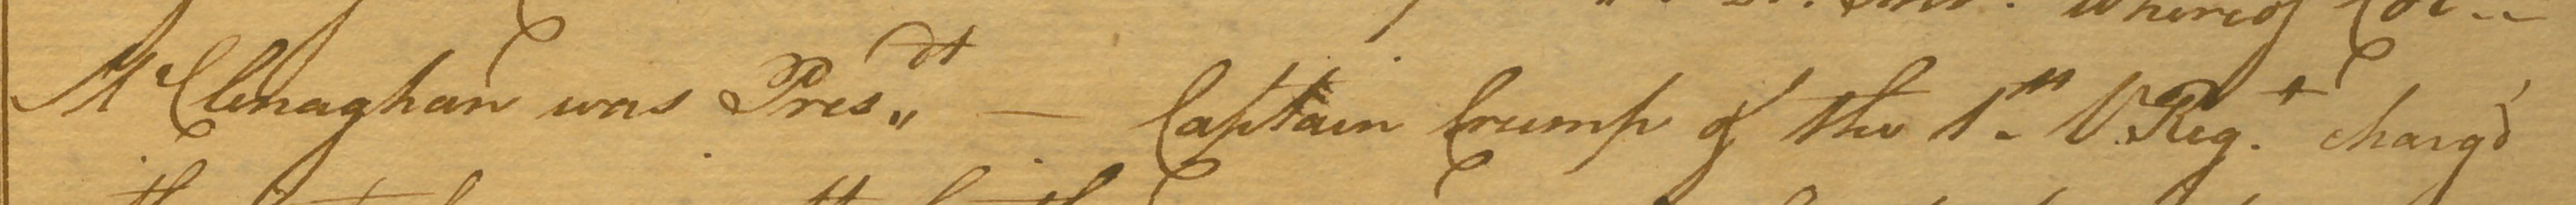M^cClenaghan was Pres^dt.- Captain Crump of the 1^st. V Reg^t. charg'd
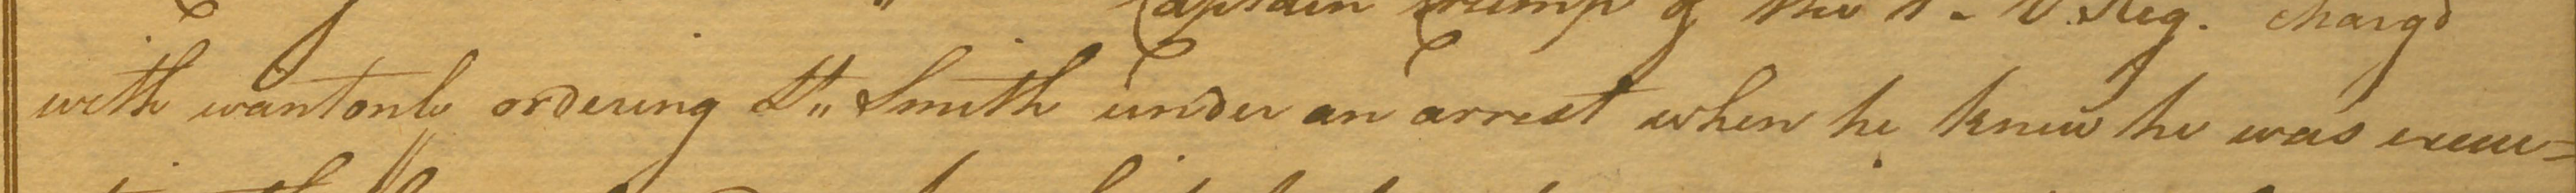with wantonly ordering L^t. Smith under an arrest when he knew he was execu-
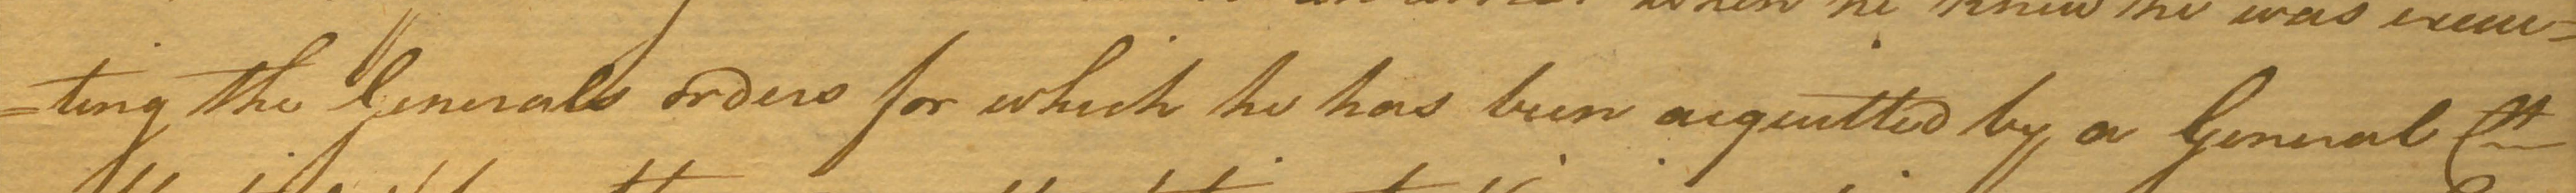-ting the Generals orders for which he has been acquitted by a General C^t.
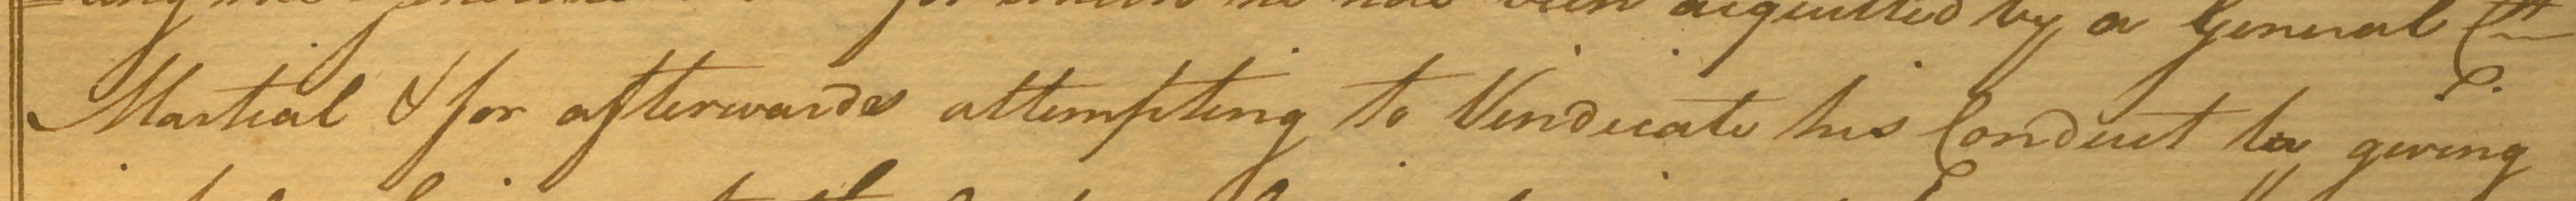Martial & for afterwards attempting to Vindicate his Conduct by giving
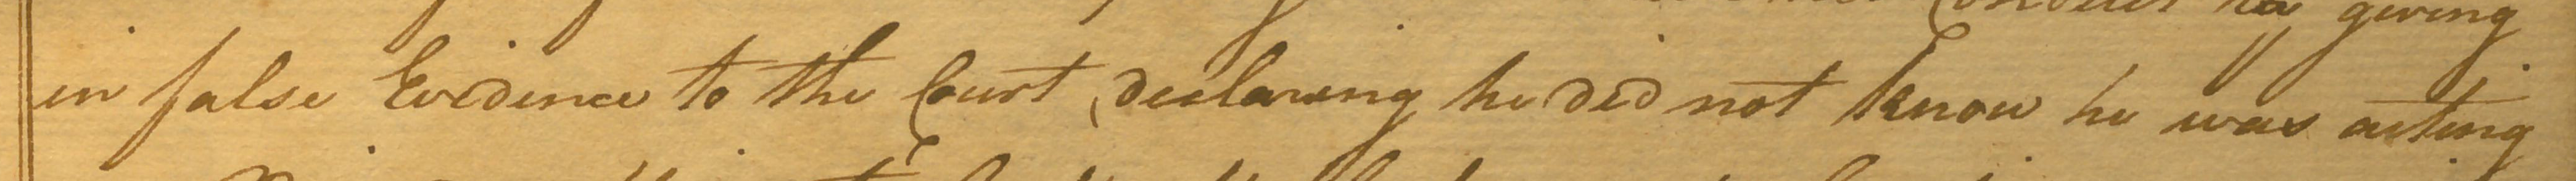in false Evidence to the Court, declaring he did not know he was asking
